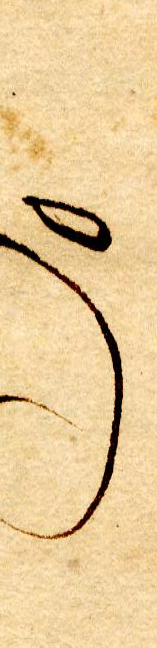T0
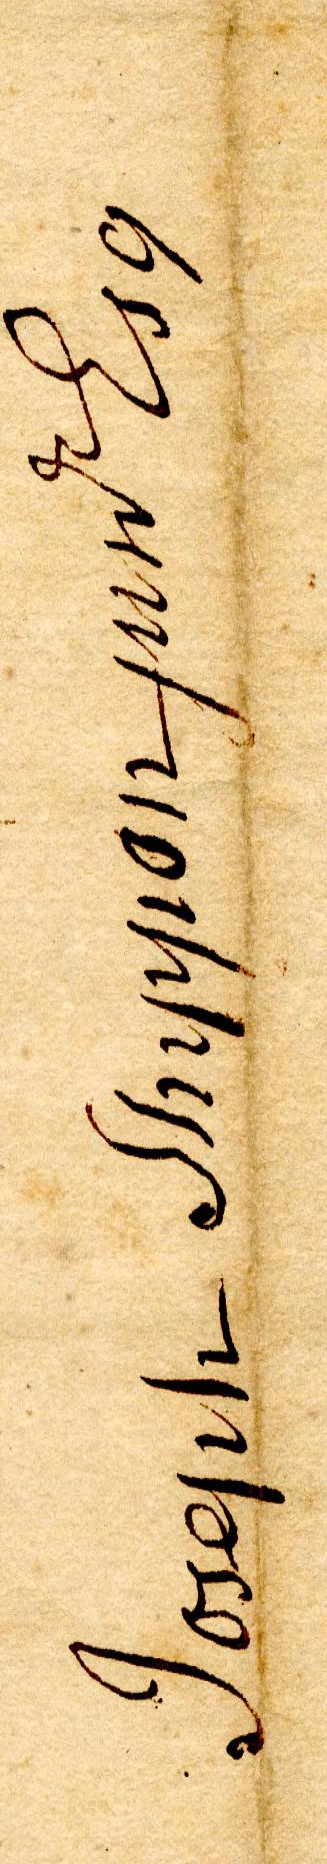Joseph Shippen jun^r Esq
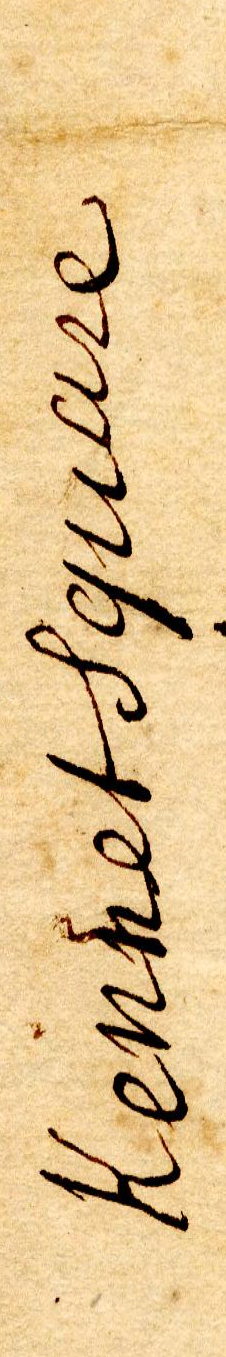Kennet Square
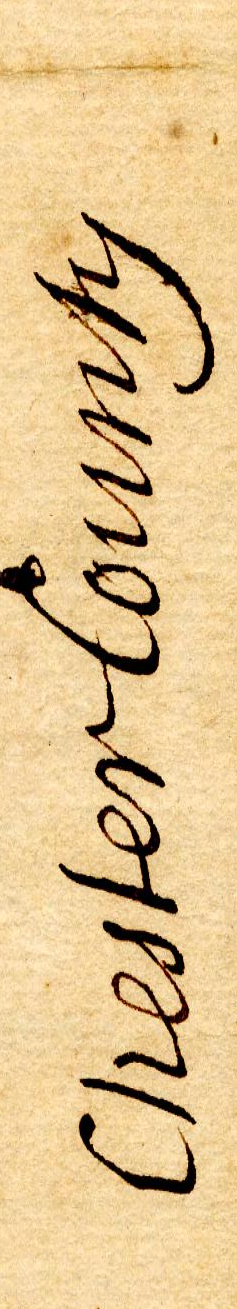Chester County
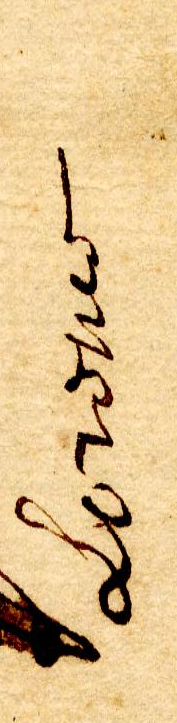Loudnes
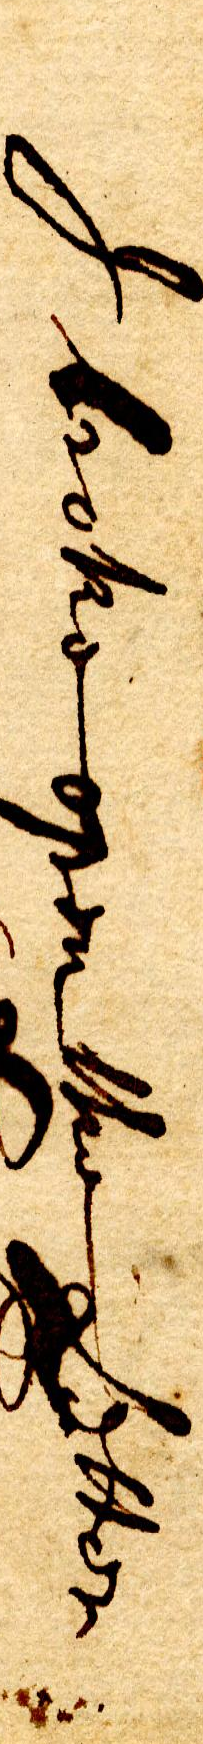I broke open the Letter
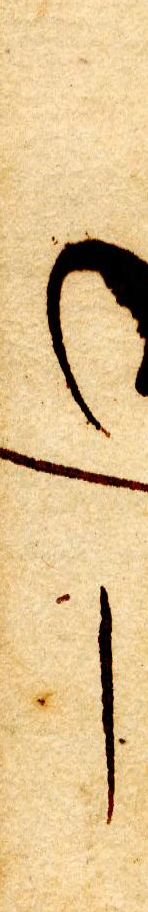ES.-
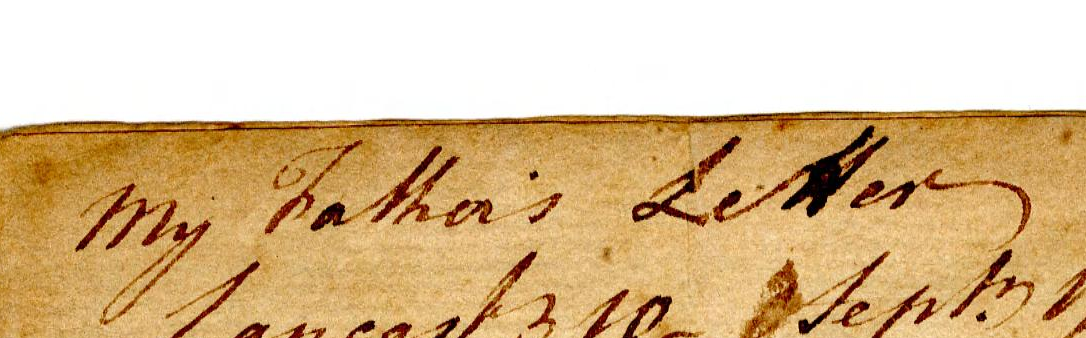My Father's Letter
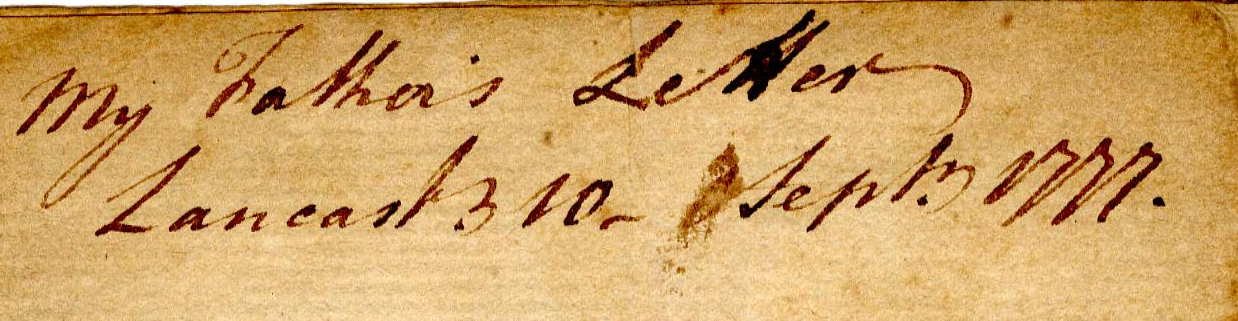Lancast^r. Sept^r. 1777.
